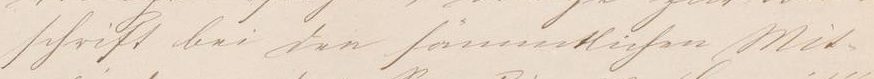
schrift bei den sämmtlichen Mit-
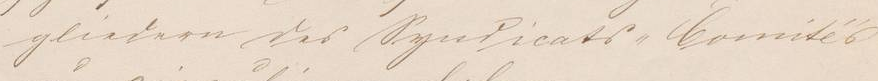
gliedern des Syndicats-Comités
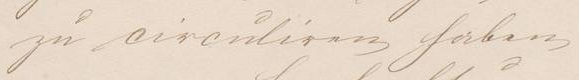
zu circuliren haben.
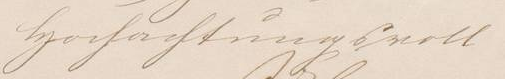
Hochachtungsvoll
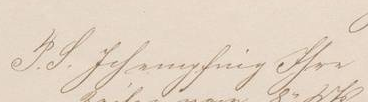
P. S. Ich empfing Ihre
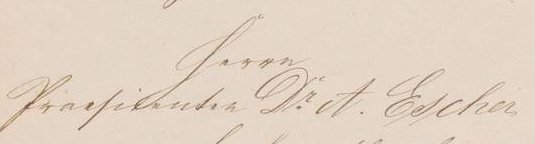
Praesidenten Dr A. Escher
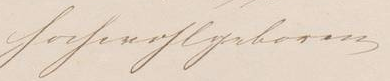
Hochwohlgeboren
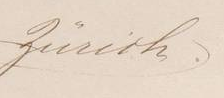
Zürich.
